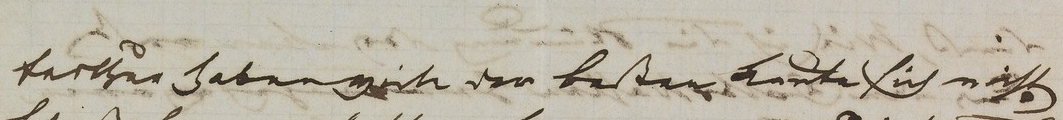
terthur haben viele der besten Leute sich nicht
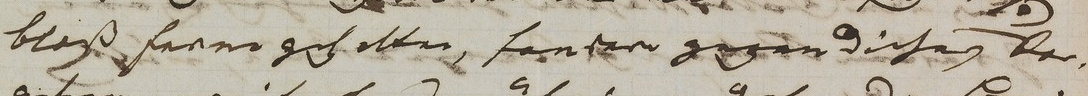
bloß ferne gehalten, sondern gegen dieses Vor-
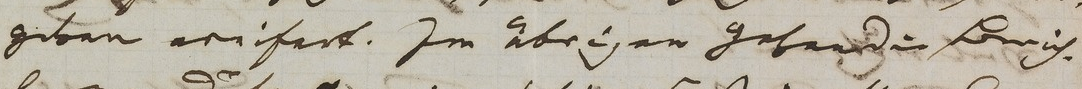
gehen ereifert. Im übrigen gehen die Berich-
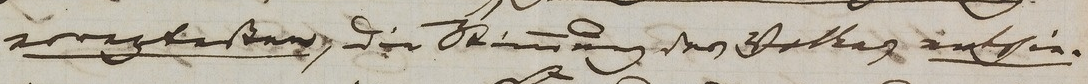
erregtesten, die Stimmung des Volkes entschie-
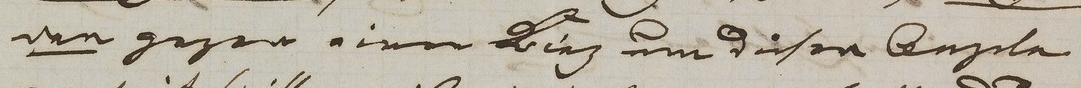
den gegen einen Krieg um dieser Angele-
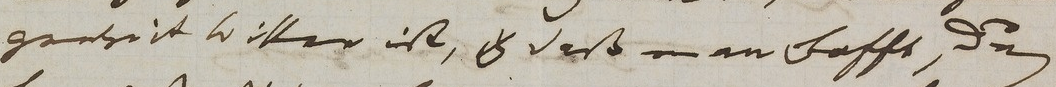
genheit willen ist, & daß man hofft, Du
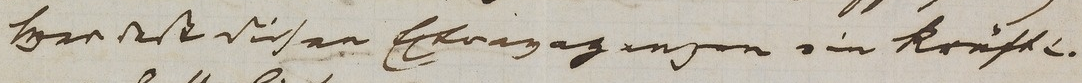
werdest diesen Extravaganzen ein kräfti-
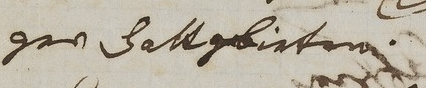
ges Halt gebieten.
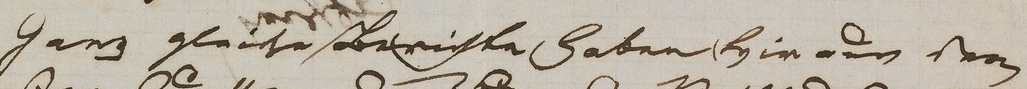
Ganz gleiche Berichte haben wir aus den
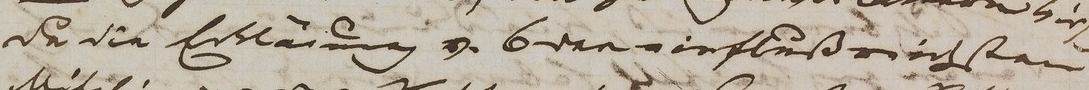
Du die Erklärung von v. 6 der einflußreichsten
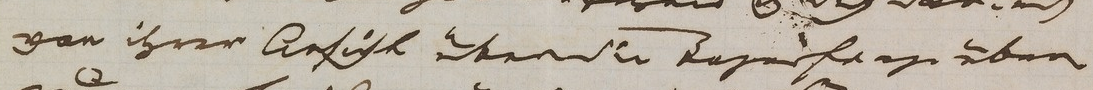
von ihrer Ansicht über die Tagesfrage über-
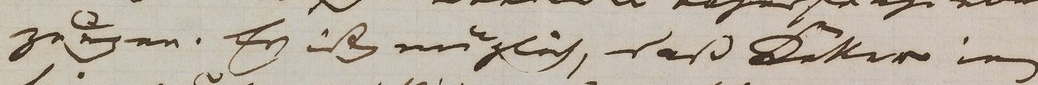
zeugen. Es ist möglich, daß Keller in
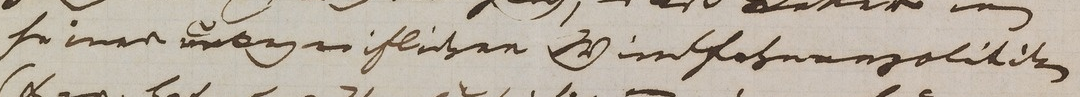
seiner unbegreiflichen Windfahnenpolitik
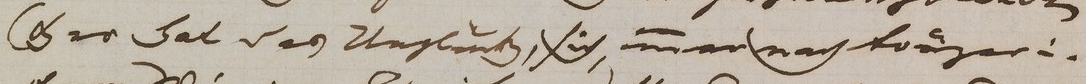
(& er hat das Unglück, sich immer nach trügeri-
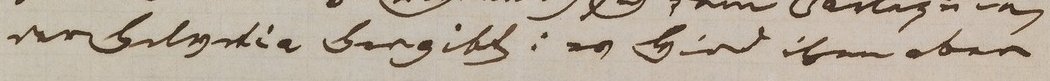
der Helvetia hergibt: es wird ihm aber
